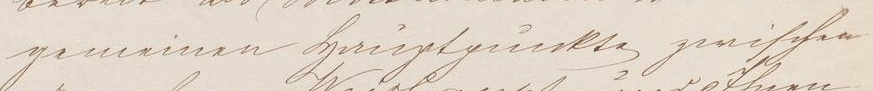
gemeinen Hauptpunkte zwischen
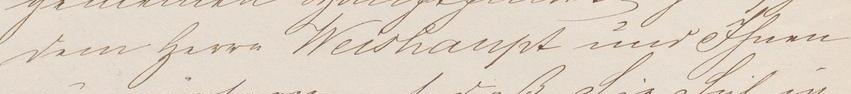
dem Herrn Weishaupt und Ihnen
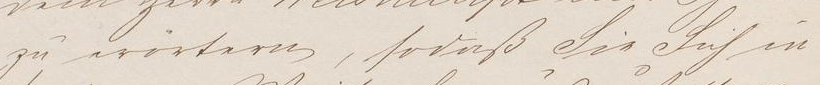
zu erörtern, sodaß Sie Sich in
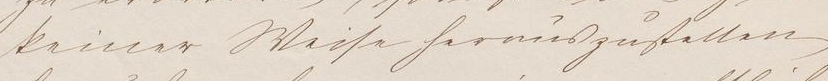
keiner Weise herauszustellen
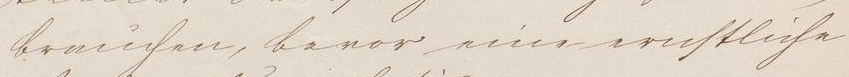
brauchen, bevor eine ernstliche
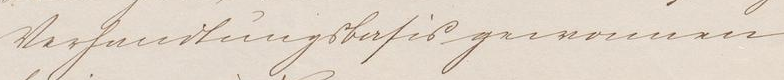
Verhandlungsbasis gewonnen
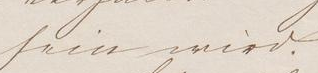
sein wird.
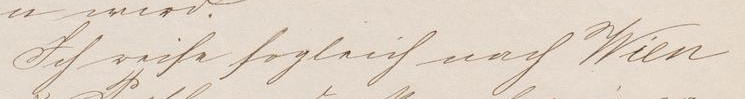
Ich reise sogleich nach Wien
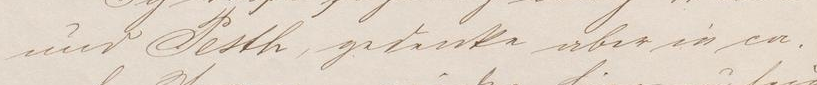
und Pesth, gedenke aber in ca.
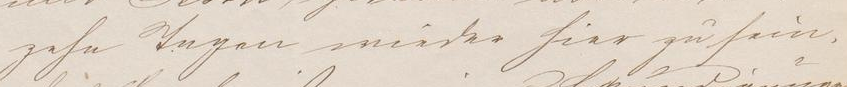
zehn Tagen wieder hier zu sein.
